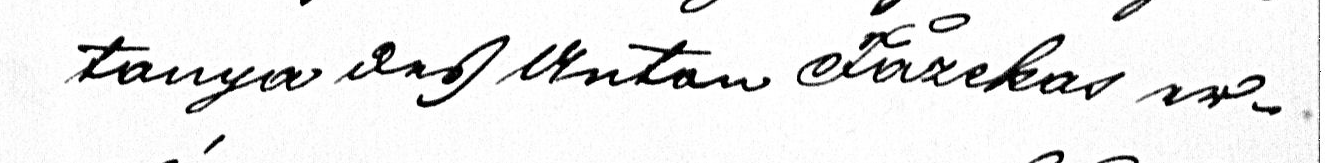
tanya des Anton Fazekas er¬
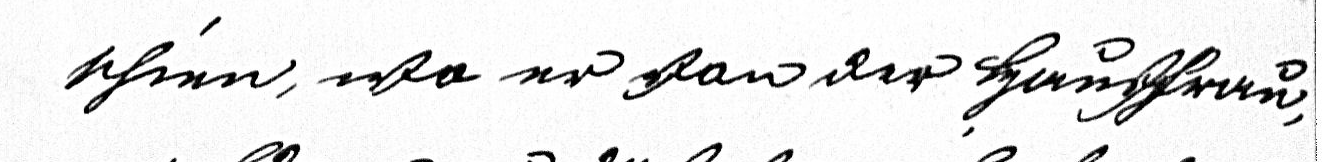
schien, wo er von der Hausfrau,
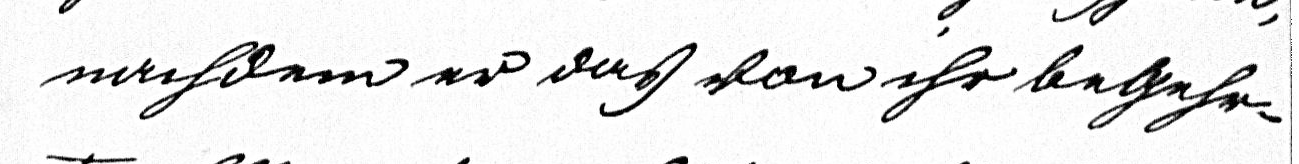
nachdem er das von ihr begehrte
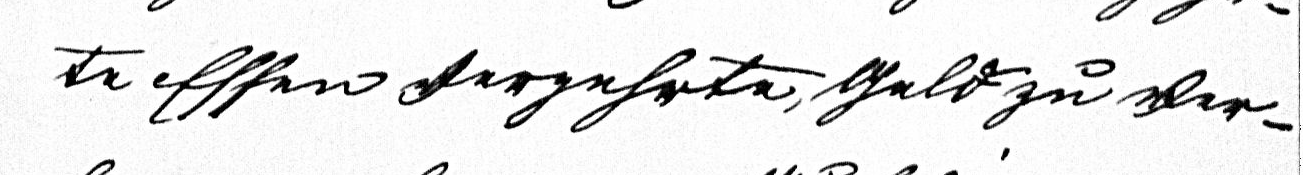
Essen vergehrte, Geld zu ver¬
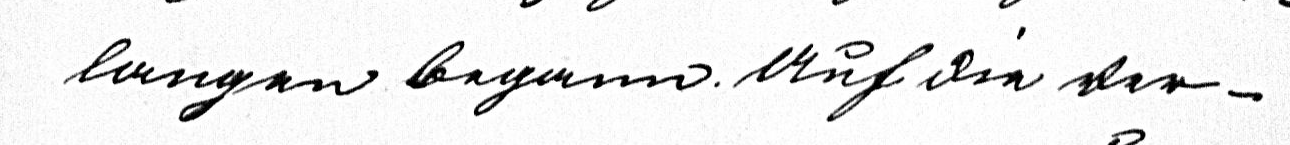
langen begann. Auf die ver¬
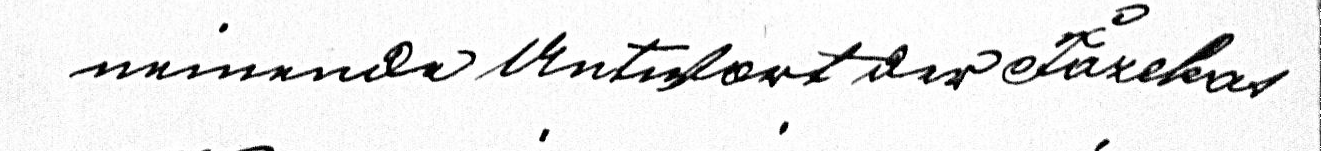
neinende Antwort der Fazekas
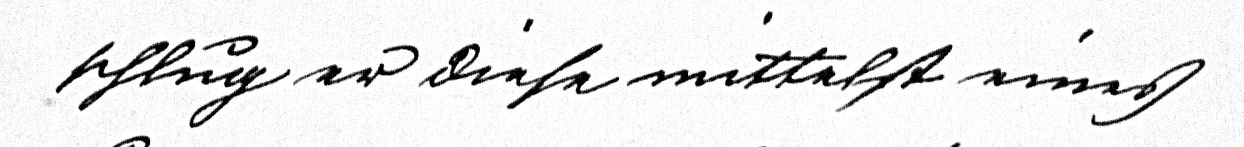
schlug er diese mittelst eines
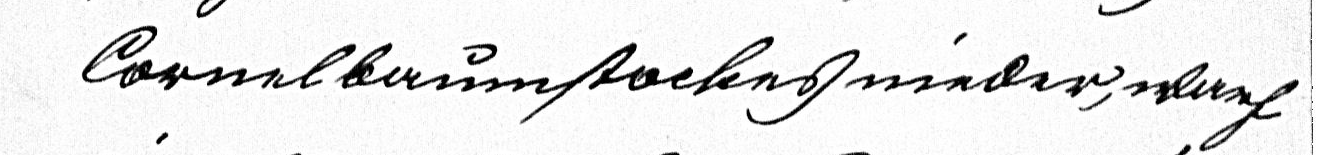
Cornel baumstockes nieder, warf
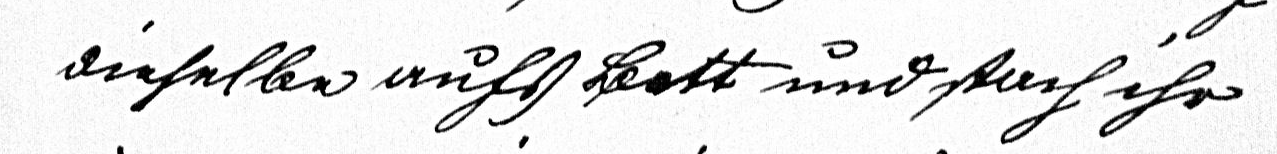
dieselbe aufs Bett und stach ihr
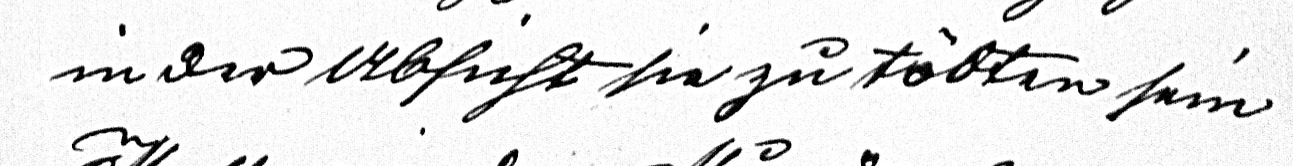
in der Absicht sie zu tödten sein
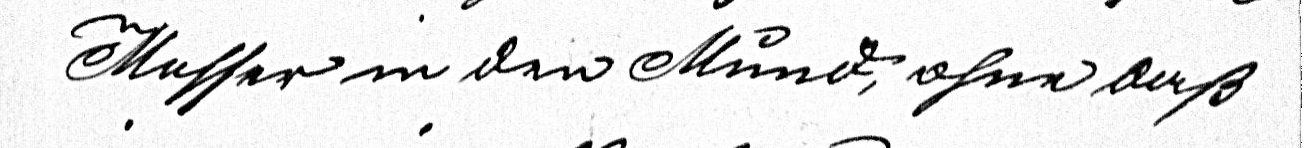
Messer in den Mund, ohne daß
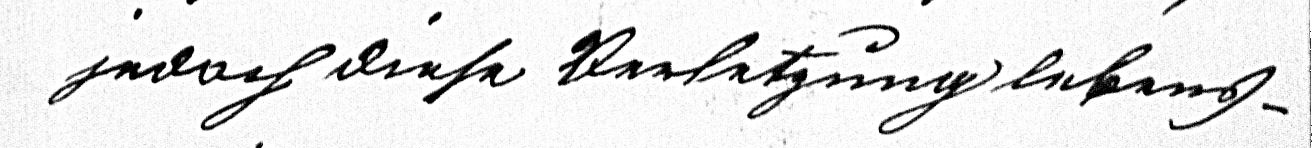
jedoch diese Verletzung lebens¬
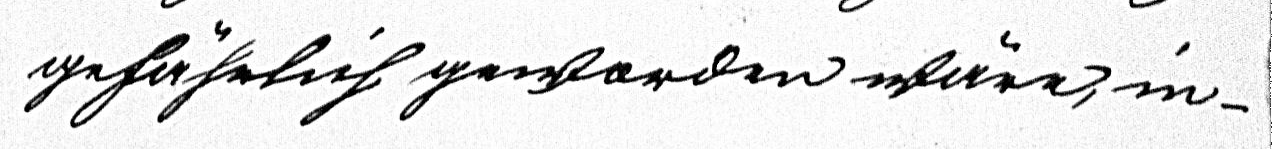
gefährlich geworden wäre, in¬
